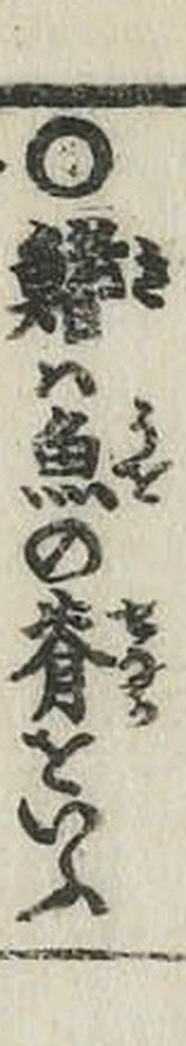○鰭は魚の背をいふ
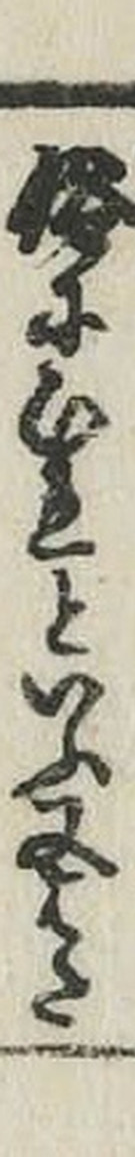俗にひれといふ又はた
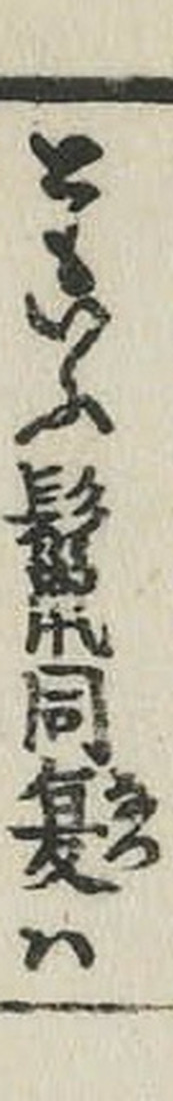ともいふ鬣同夏は
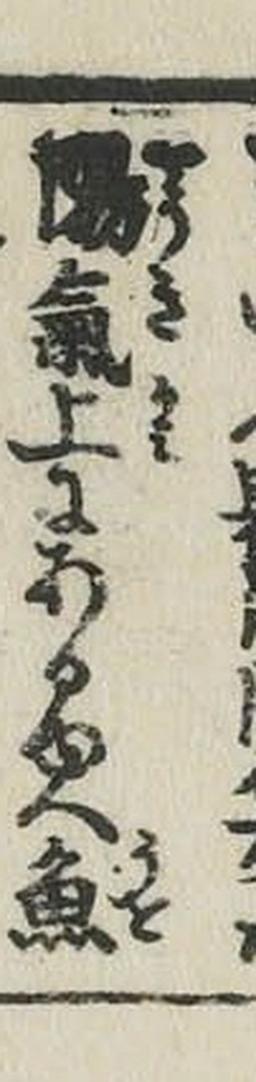陽気上にあるゆへ魚
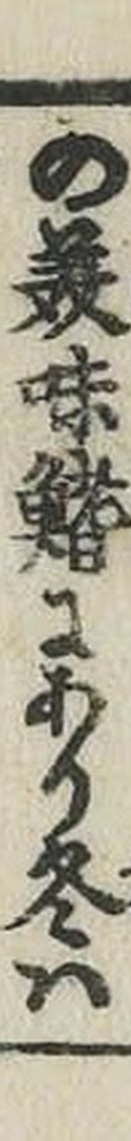の美味鰭にあり冬は
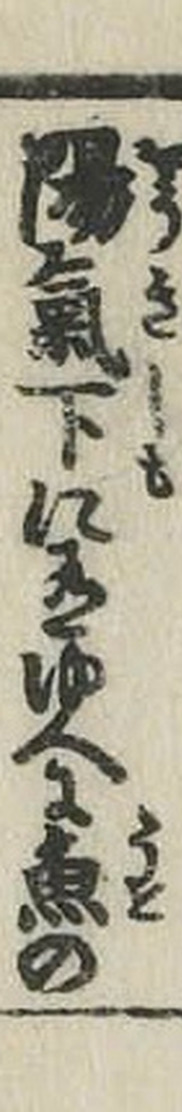陽気下に有ゆへに魚の

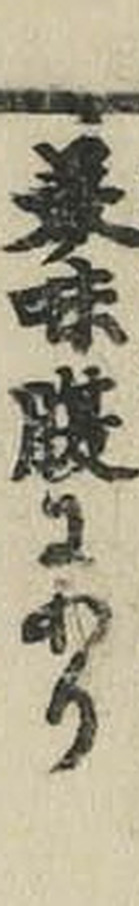美味腹にあり
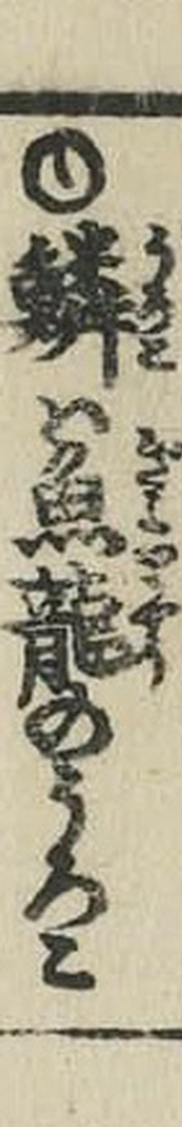○鱗は魚龍のうろこ
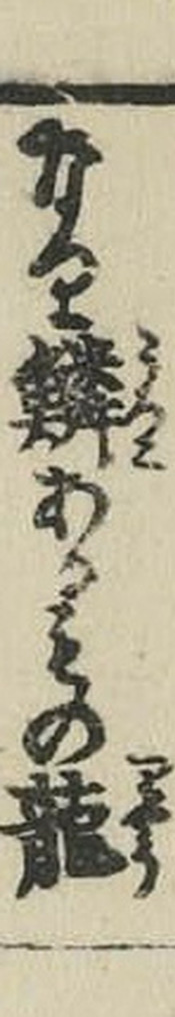なり鱗あるもの龍
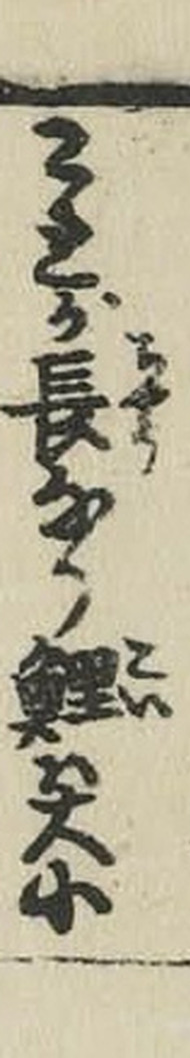これが長なり鯉は大小
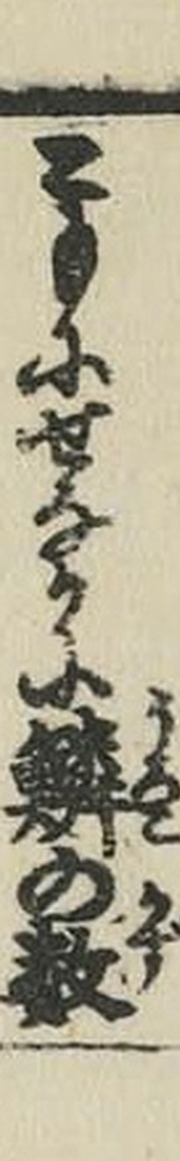ともにせなかに鱗の数
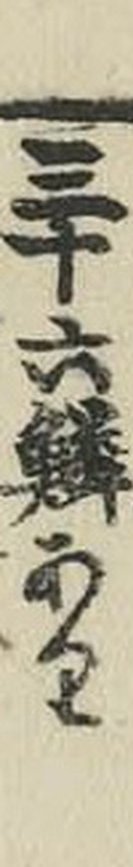三十六鱗あり
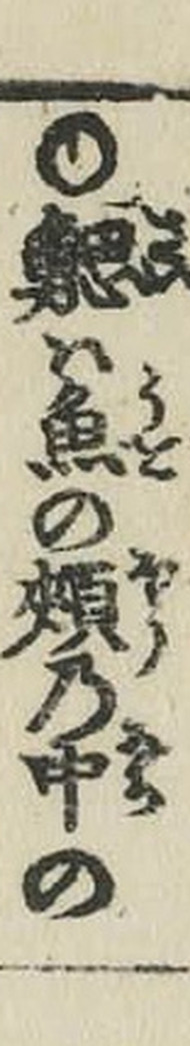○鰓は魚の頬の中の
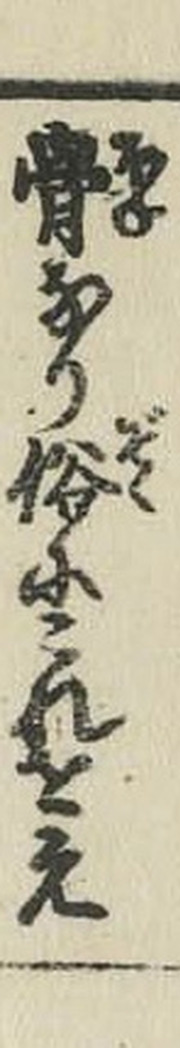骨なり俗にこれをえ
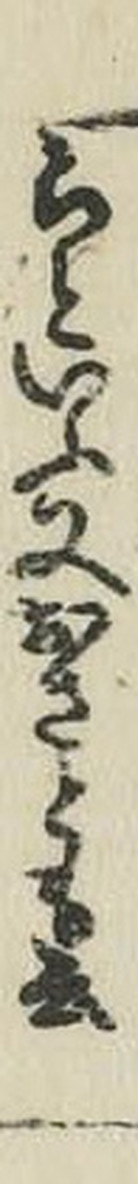らといふ又おさとも云
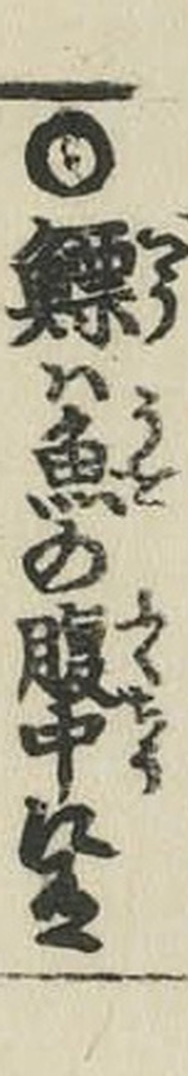○鰾は魚の腹中に有
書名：増補頭書訓蒙図彙大成 10巻 7:巻之14-16
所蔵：東京学芸大学教育コンテンツアーカイブ
